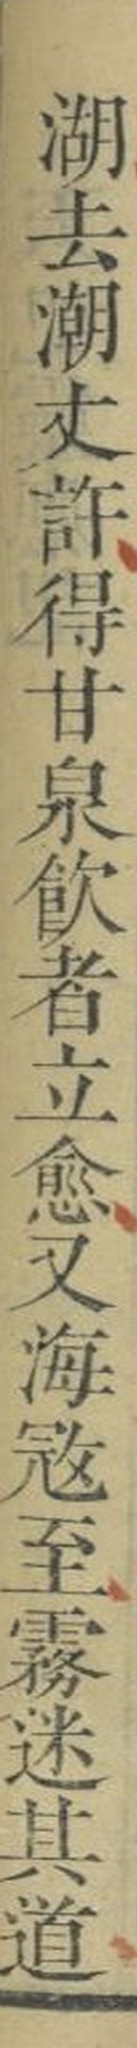湖去潮丈許得甘泉飮者立愈又海冦至霧迷其道
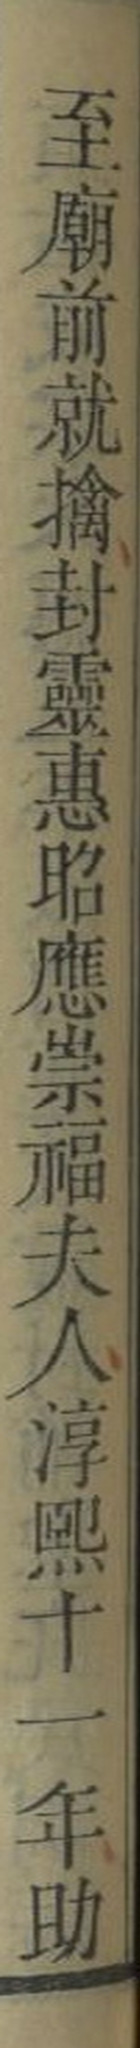至廟前就擒封靈惠昭應崇福夫人淳熙十一年助
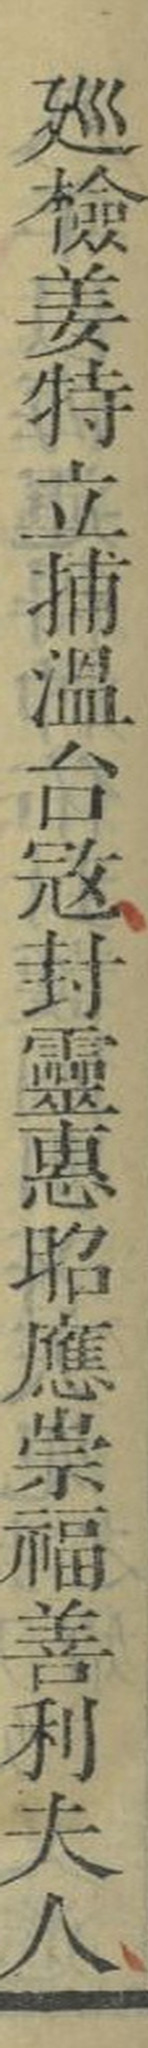廵檢姜特立捕溫台冦封靈惠昭應崇福善利夫人
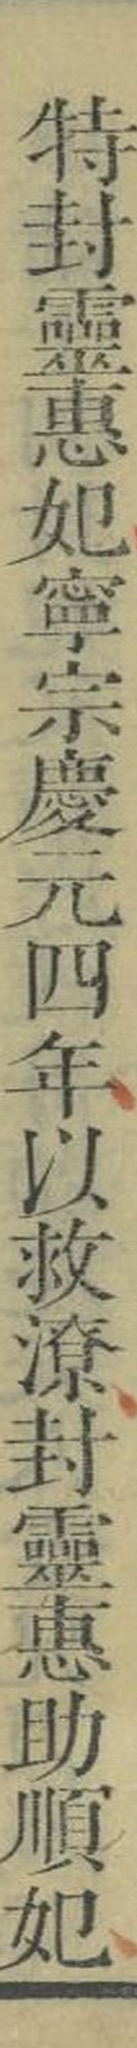特封靈惠妃寧宗慶元四年以救潦封靈惠助順妃
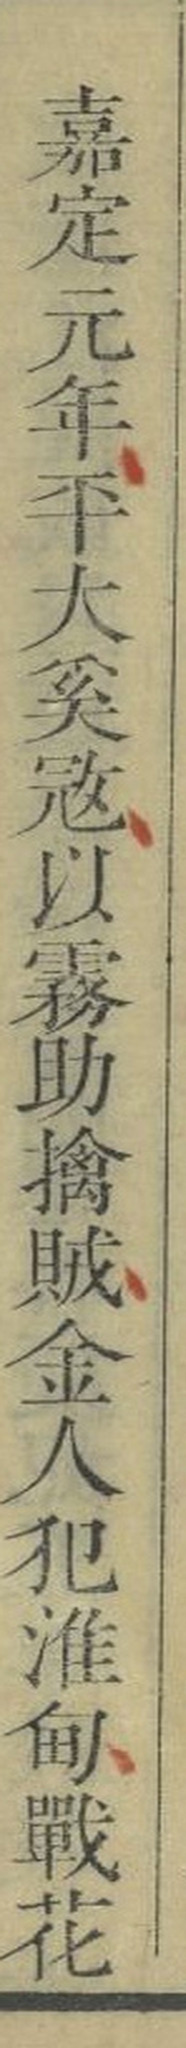嘉定元年平大奚冦以霧助擒賊金人犯淮甸戰花
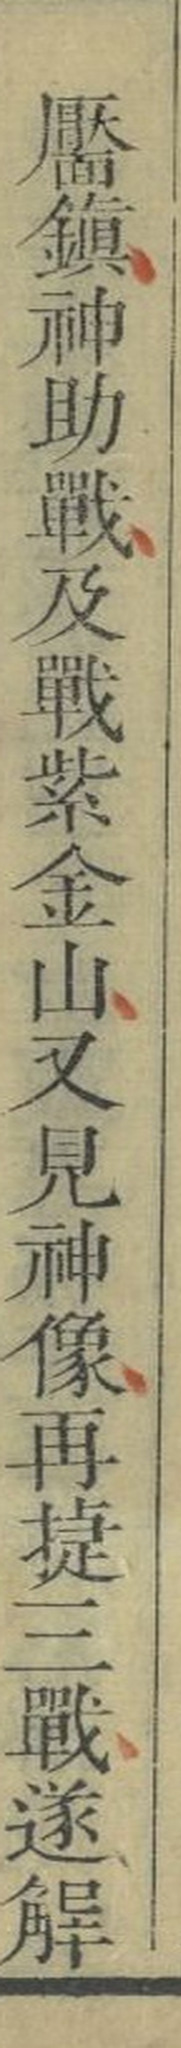靨鎭神助戰及戰紫金山又見神像再㨗三戰遂解
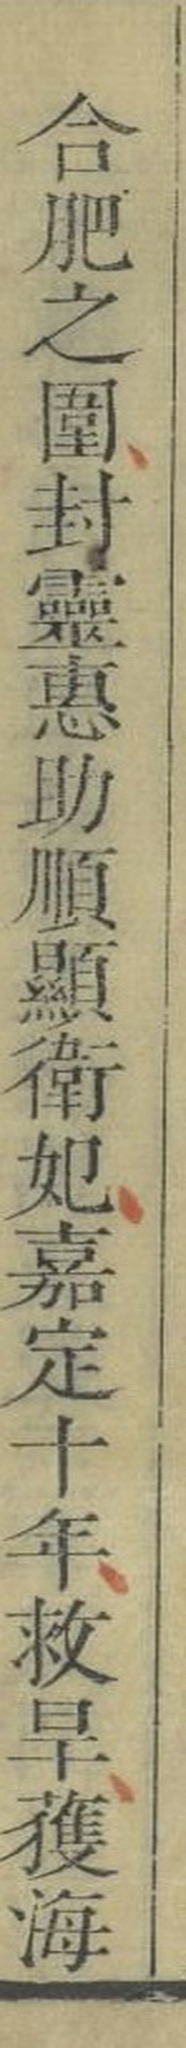合肥之圍封靈惠助順顯衛妃嘉定十年救旱獲海
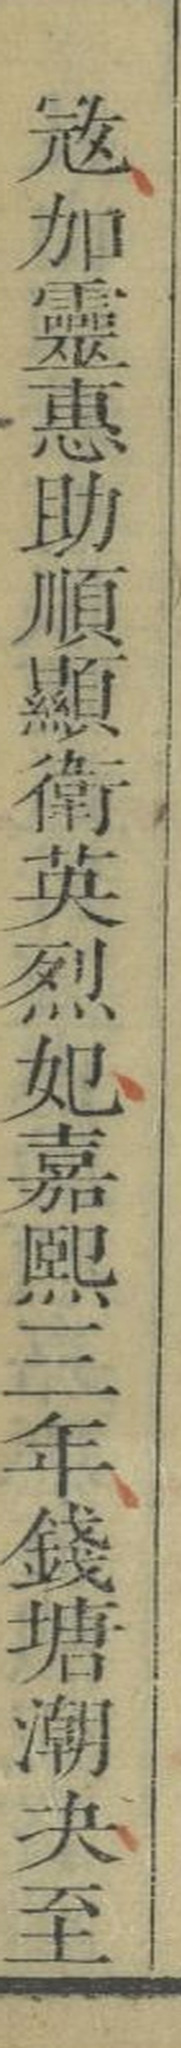冦加靈惠助順顯衛英烈妃嘉熙三年錢塘潮决至

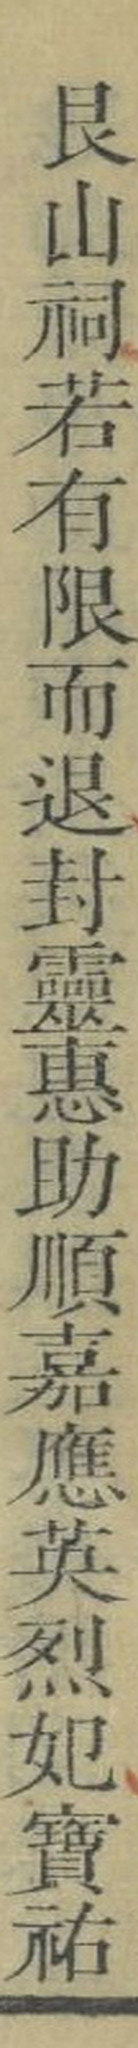艮山祠若有限而退封靈惠助順嘉應英烈妃寶祐
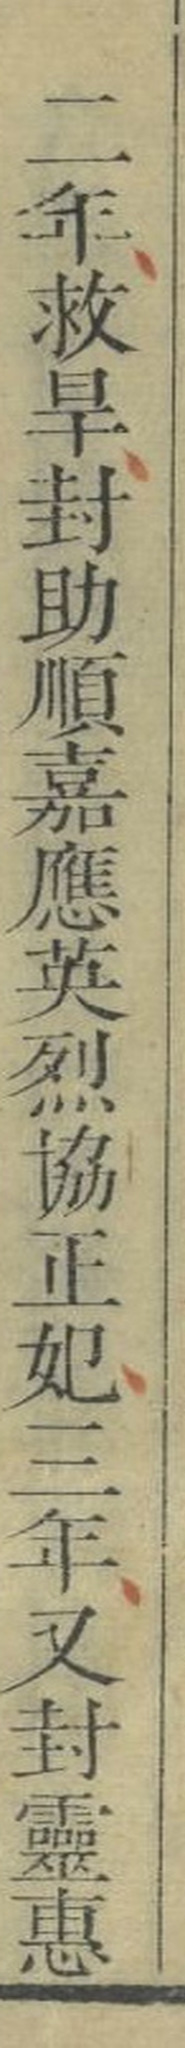二年救旱封助順嘉應英烈協正妃三年又封靈惠
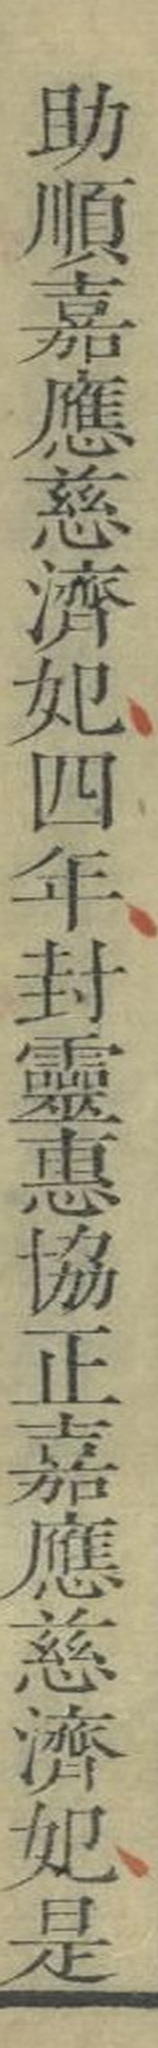助順嘉應慈濟妃四年封靈惠協正嘉應慈濟妃是
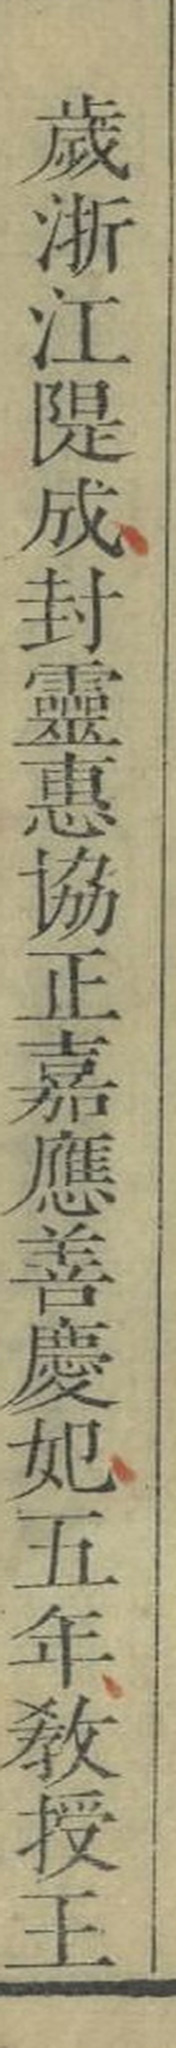歲浙江隄成封靈惠協正嘉應善慶妃五年敎授王
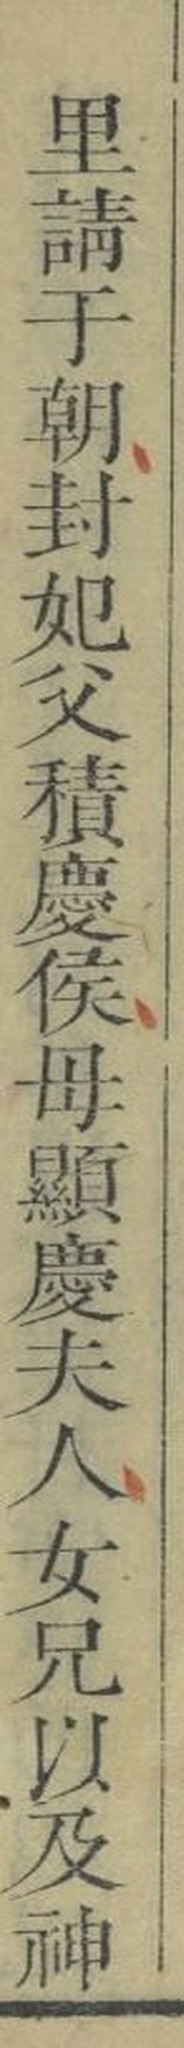里請于朝封妃父積慶侯母顯慶夫人女兄以及神
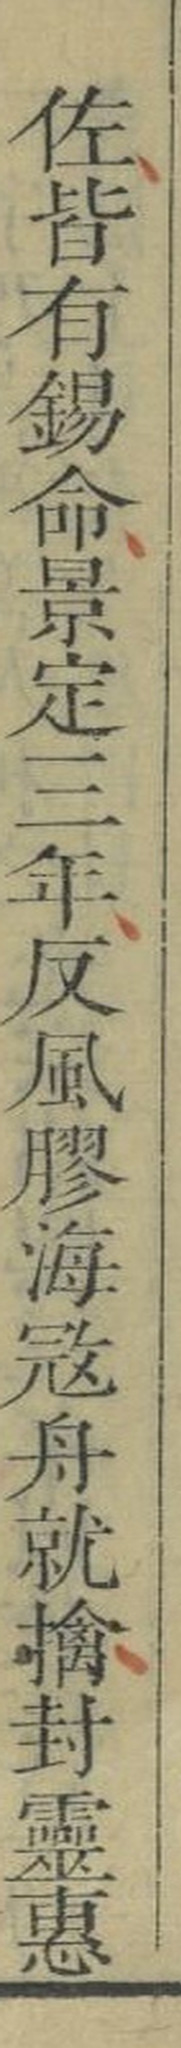佐皆有錫命景定三年反風膠海冦舟就擒封靈惠
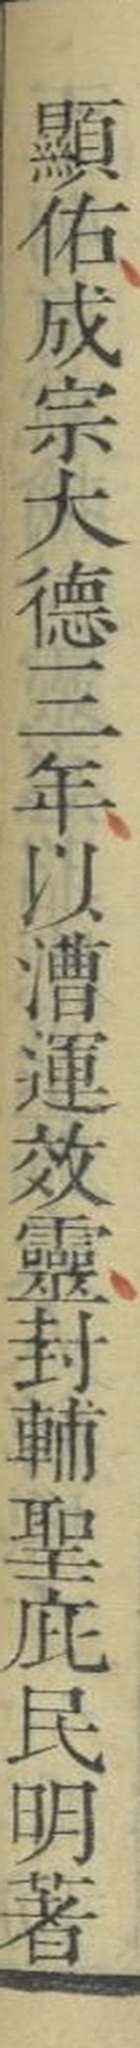顯佑成宗大德三年以漕運效靈封輔聖庇民明著
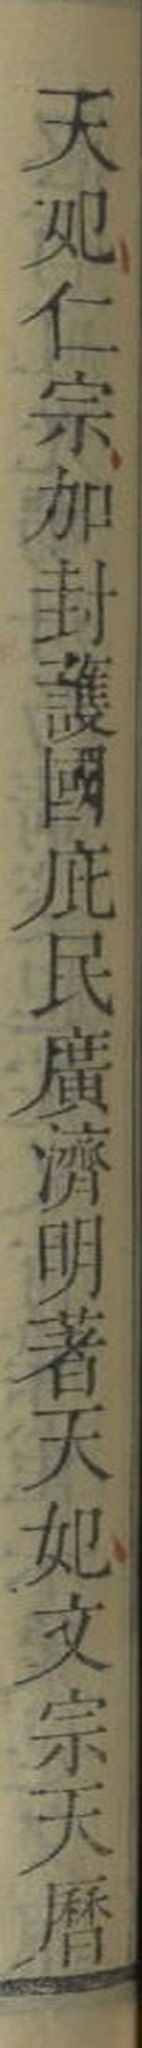天妃仁宗加封䕶國庇民廣濟明著天妃文宗天曆
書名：中山伝信録 巻一、巻二
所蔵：University of the Ryukyus Library
